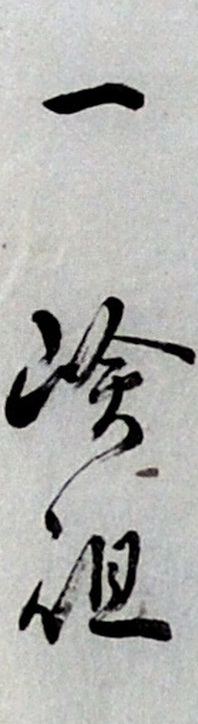一嶮岨

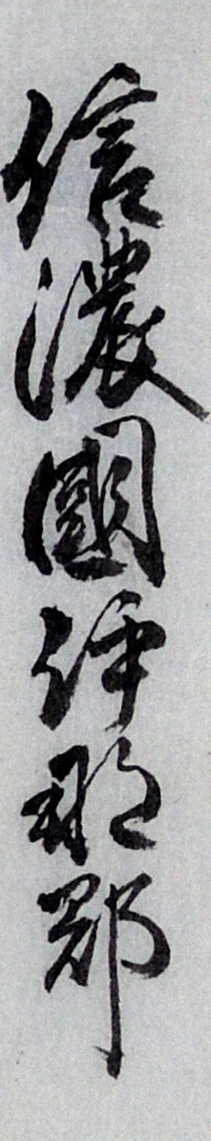信濃国伊那郡
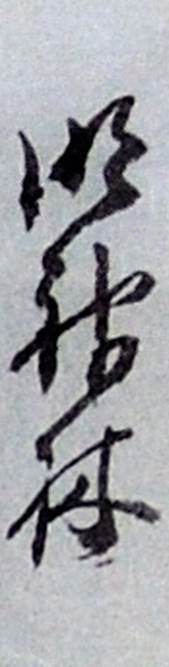明神林
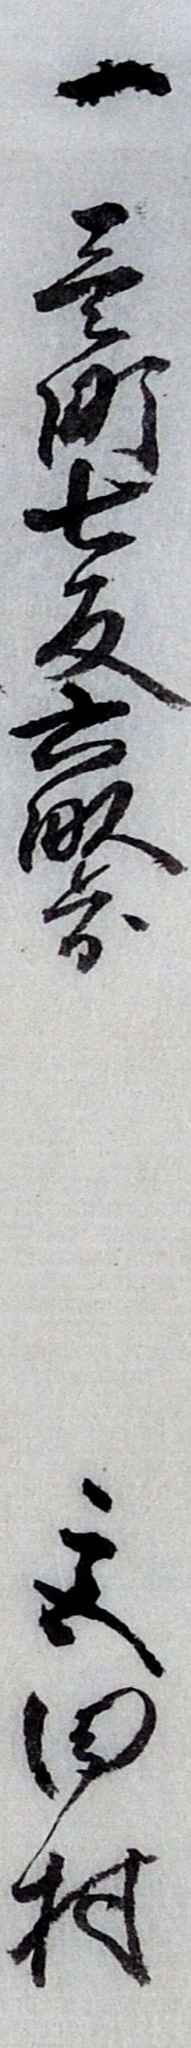一壱町七反六㽗歩宮田村
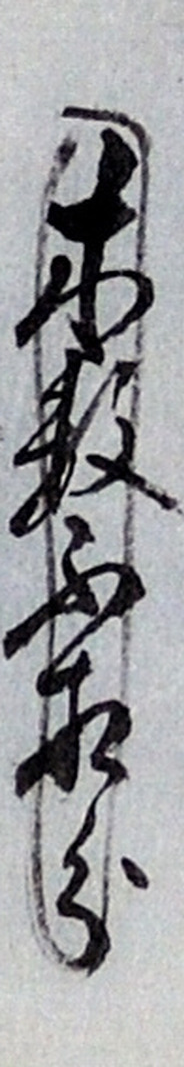木数不相分
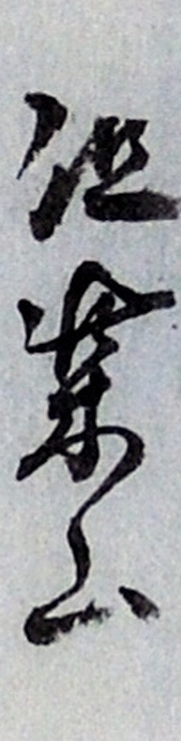但柴山
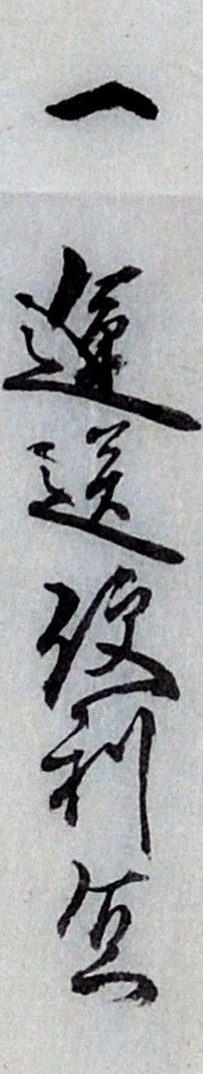一運送便利宜
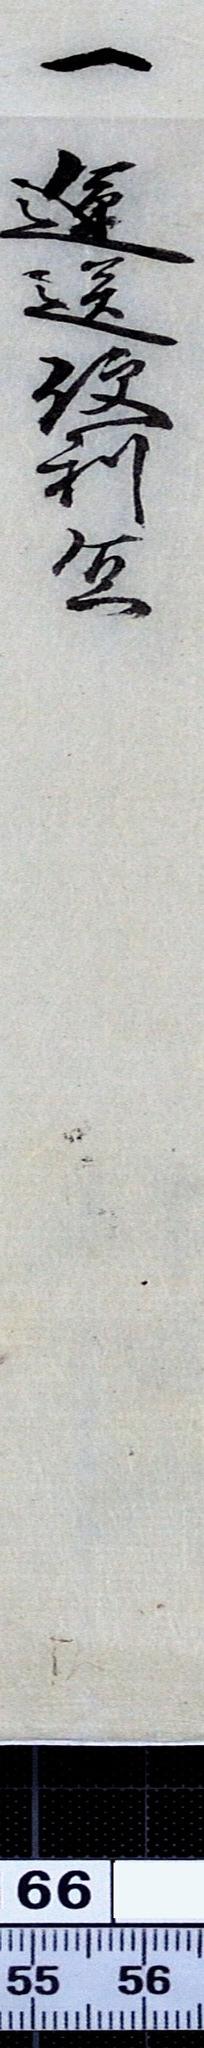一運送便利宜
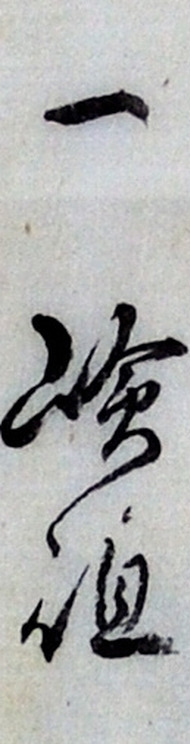一嶮岨
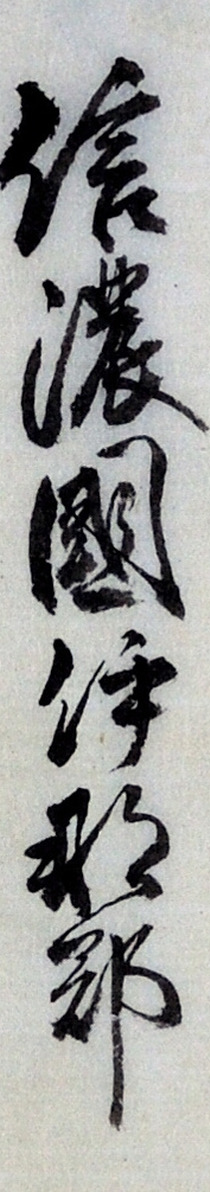信濃国伊那郡
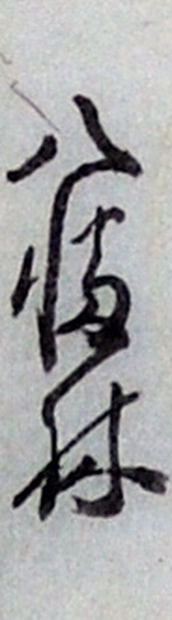八輌林
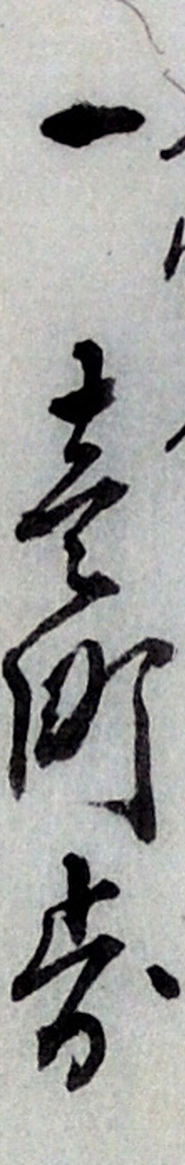一壱町歩
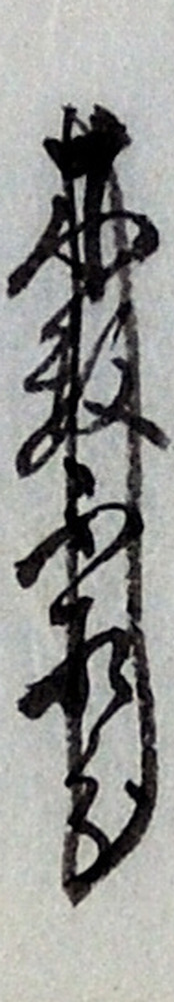木数不相分
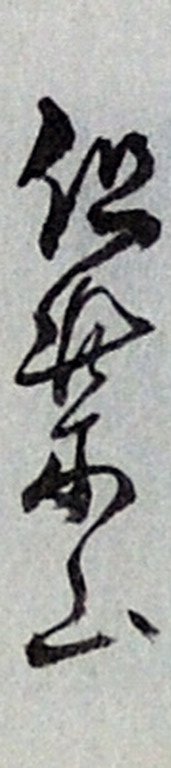但柴山

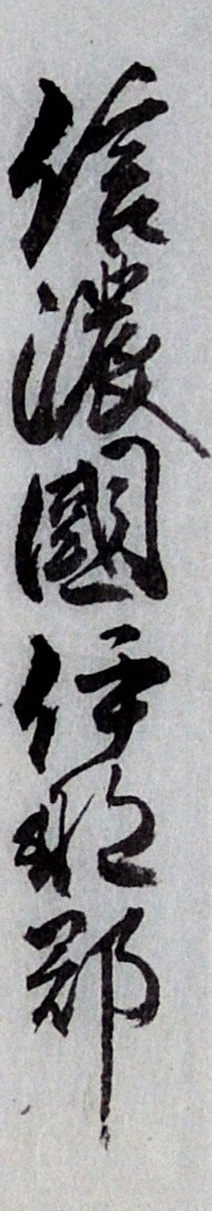信濃国伊那郡
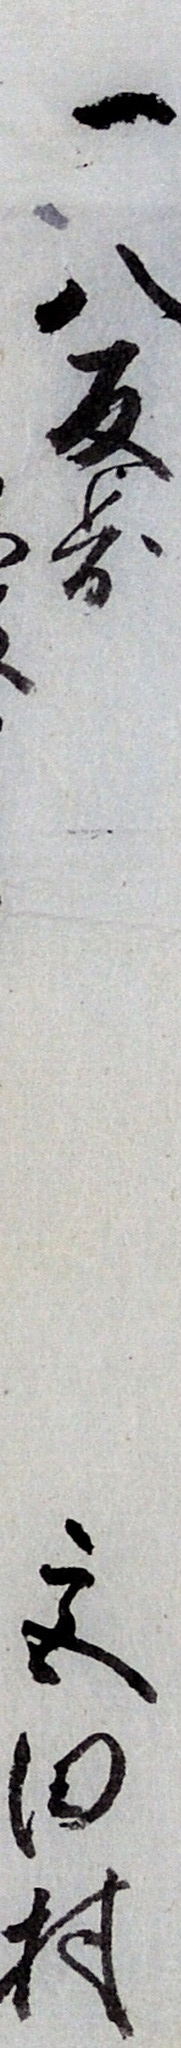一八反歩宮田村
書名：官林反別帳
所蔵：伊那市立高遠町図書館・合同会社AMANE
